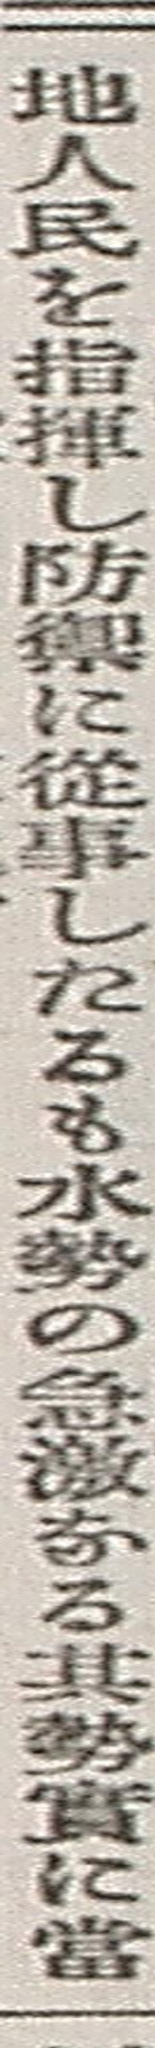地人民を指揮し防禦に従事したるも水勢の急激なる其勢実に当
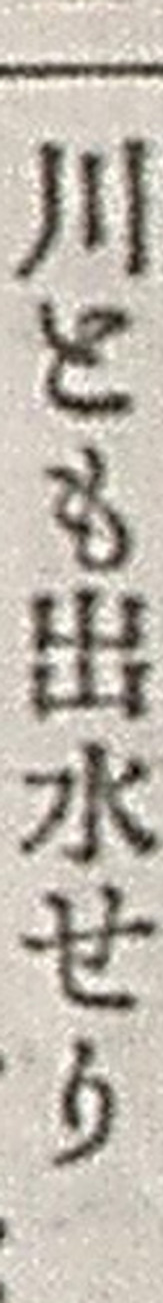川とも出水せり
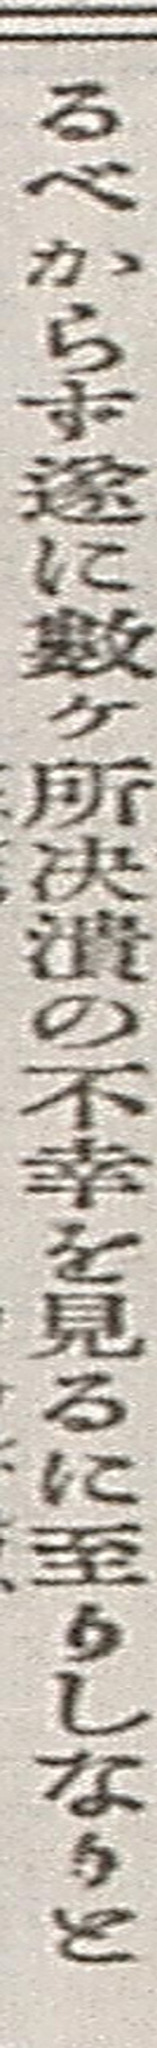るべからず遂に数ヶ所决潰の不幸を見るに至りしなりと
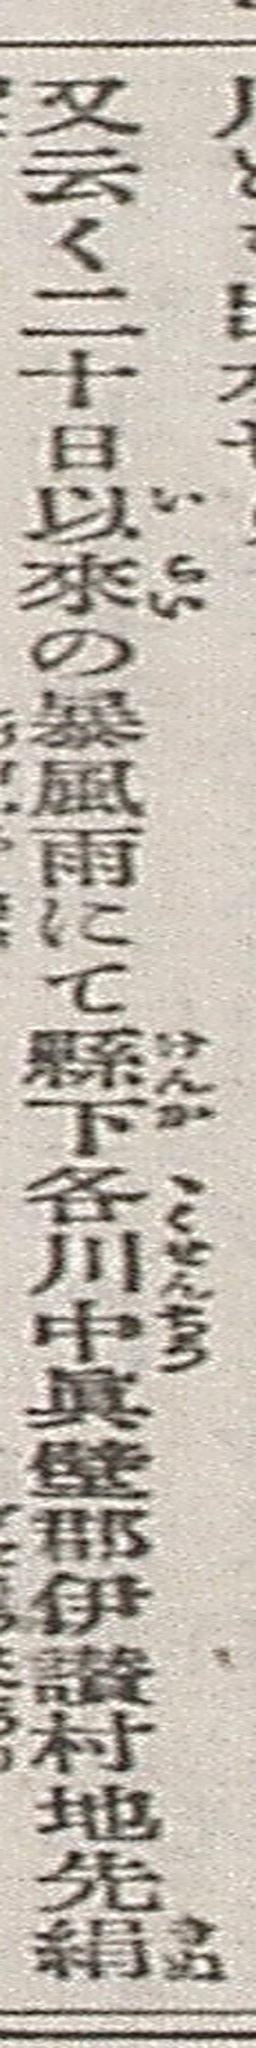又云く二十日以来の暴雨風にて県下各川中真壁郡伊讃村地先絹
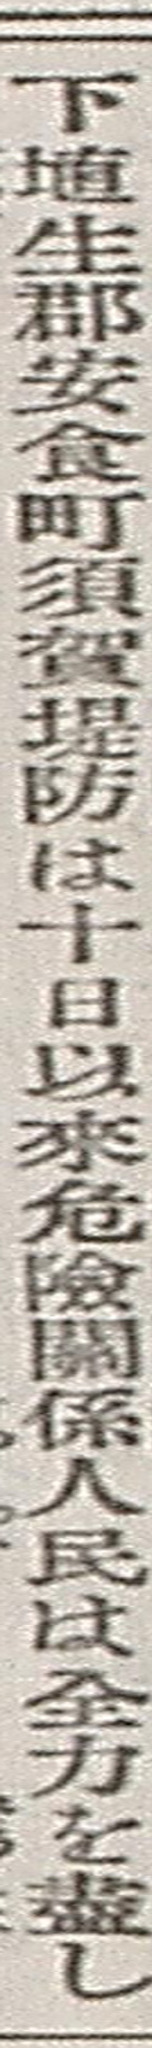下埴生郡安食町須賀堤防は十日以来危険関係人民は全力を盡し
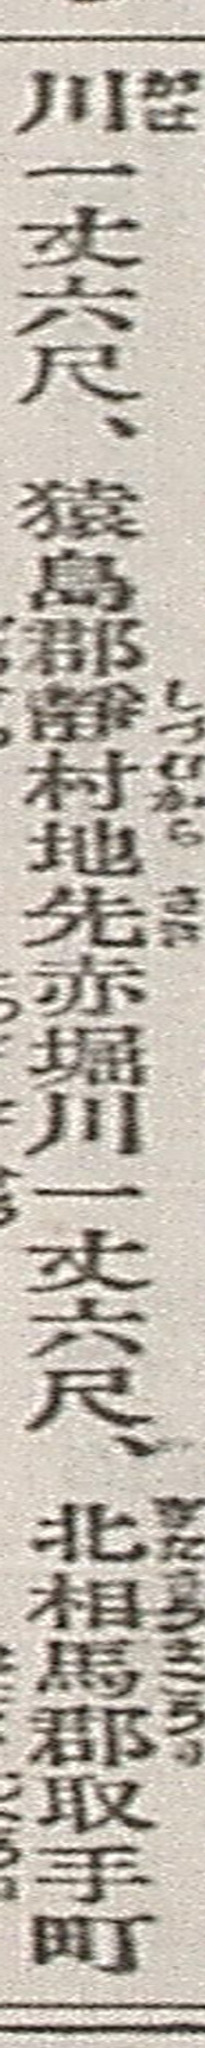川一丈六尺、猿島郡静村地先赤堀川一丈六尺、北相馬郡取手町
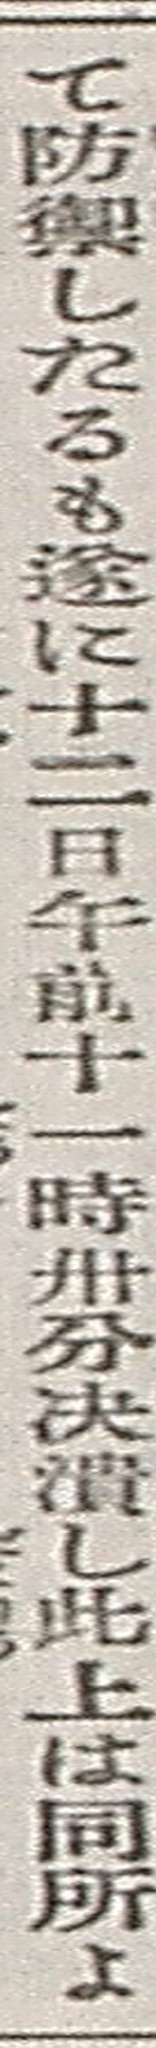て防禦したるも遂に十二日午後十一時卅分决潰し此上は同所よ
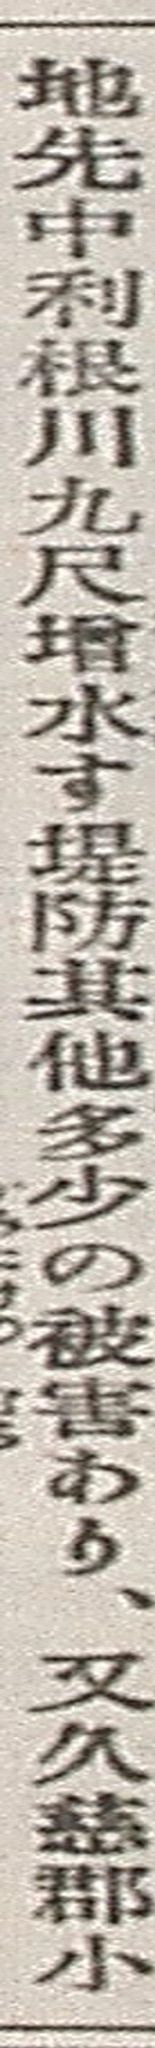地先中利根川九尺増水す堤防其他多少の被害あり、又久慈郡小
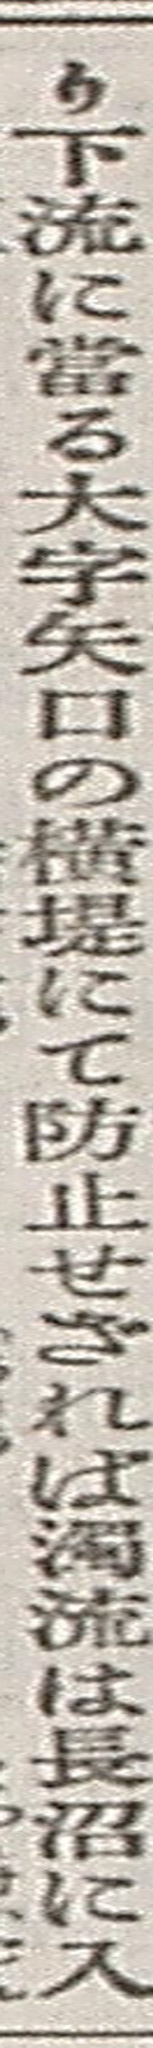り下流に当る大字矢口の横提にて防止せざれば濁流は長沼に入
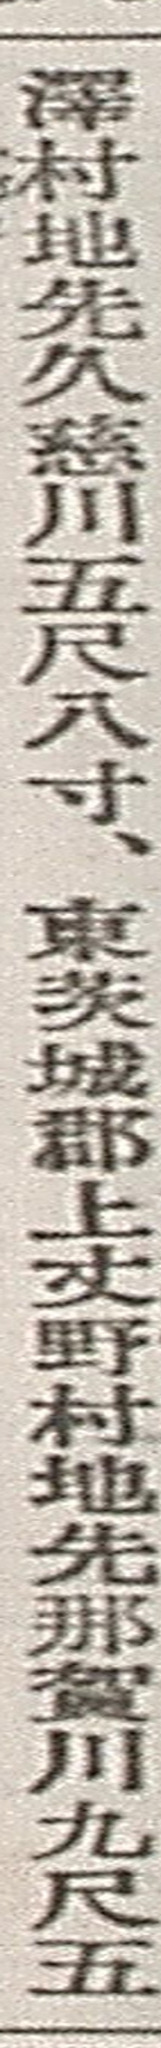沢村地先久慈川五尺八寸、東茨城郡上丈野村地先那賀川九尺五
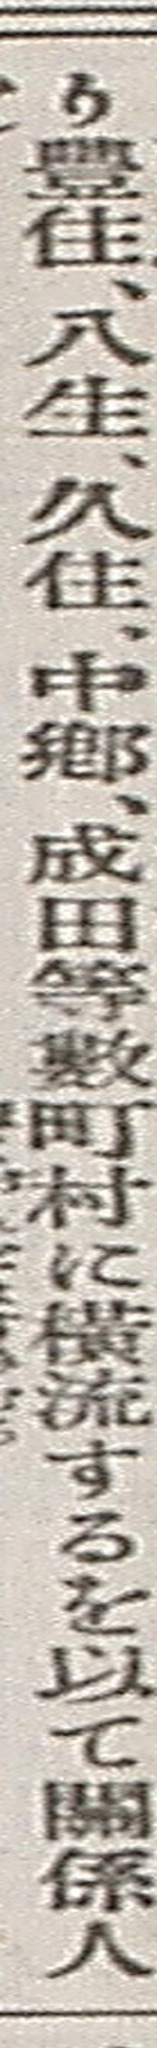り豊住、八生、久住、中郷、成田等数町村に横流するを以て関係人
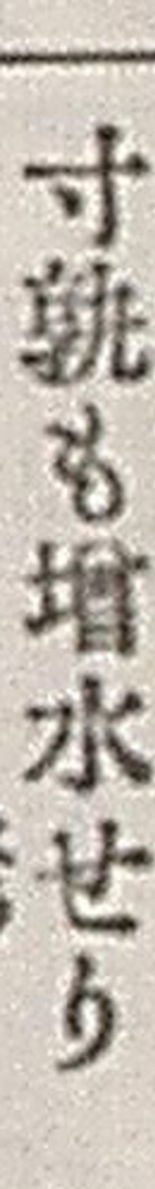寸孰も増水せり
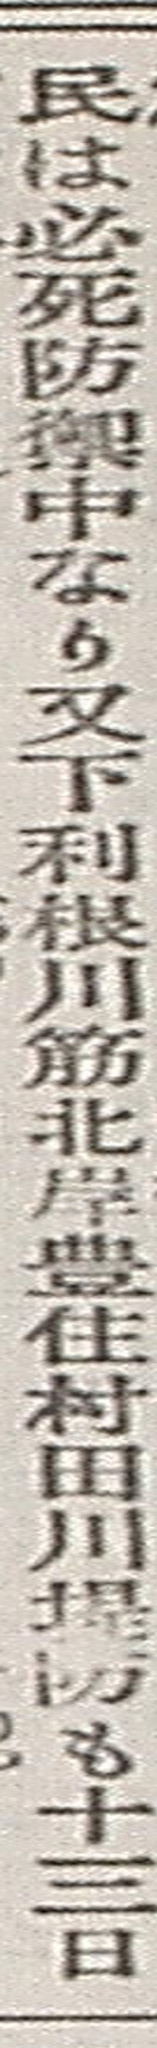民は必至防禦中なり又下利根川筋北岸豊住村田川堤防も十三日
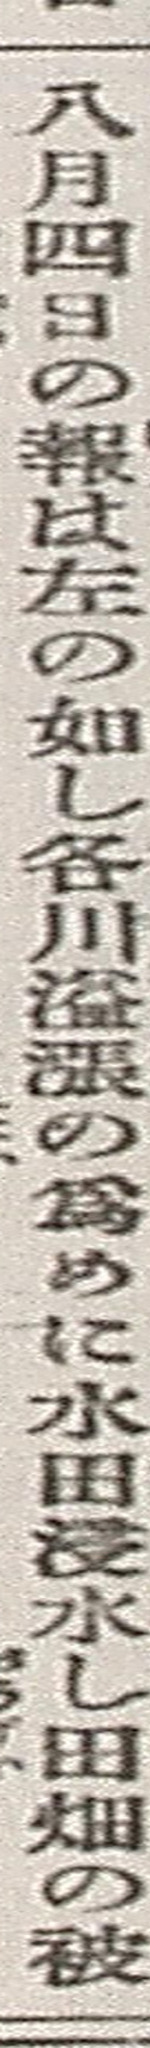八月四日の報は左の如し各川溢漲の為めに水田浸水し田畑の被
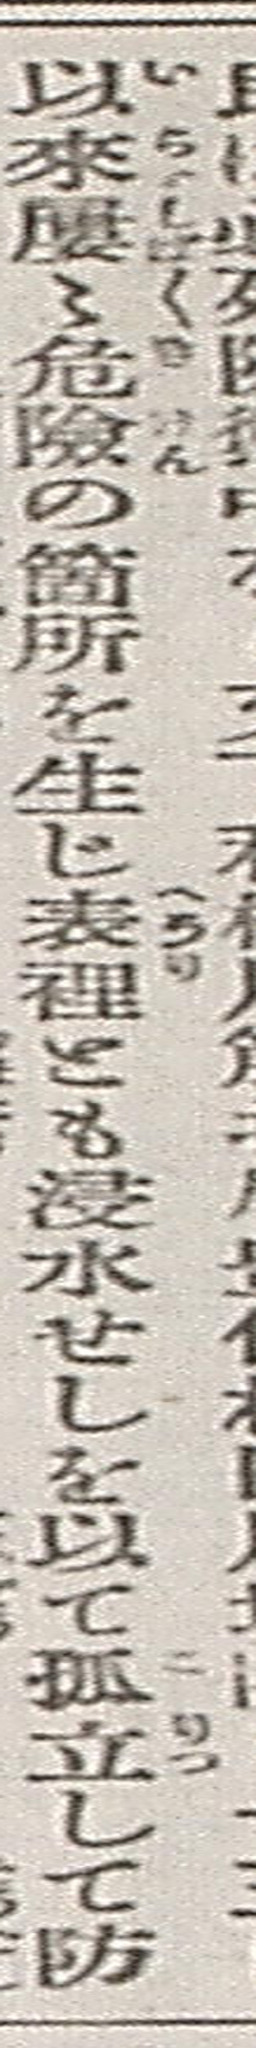以来屡々危険の箇所を生じ表裡とも浸水せしを以て孤立して防
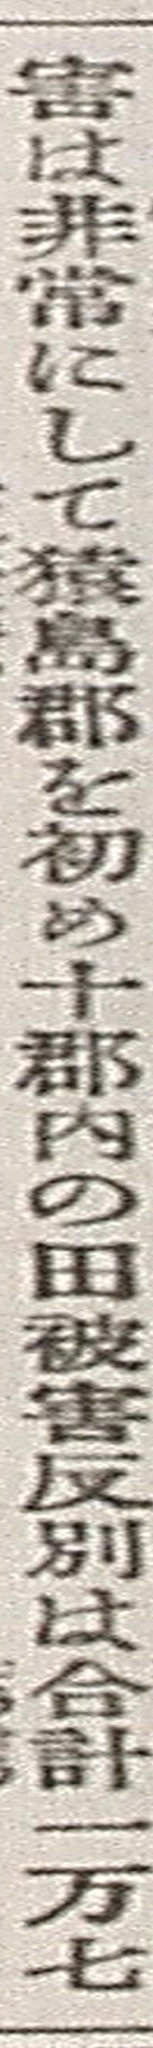害は非常にして猿島郡を初め十郡内の田被害反別は合計一万七
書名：風俗畫報臨時増刊第百二十八號　洪水被害録（下）
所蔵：東京大学地震研究所図書室 Earthquake Research Institute Library, The University of Tokyo, JAPAN
